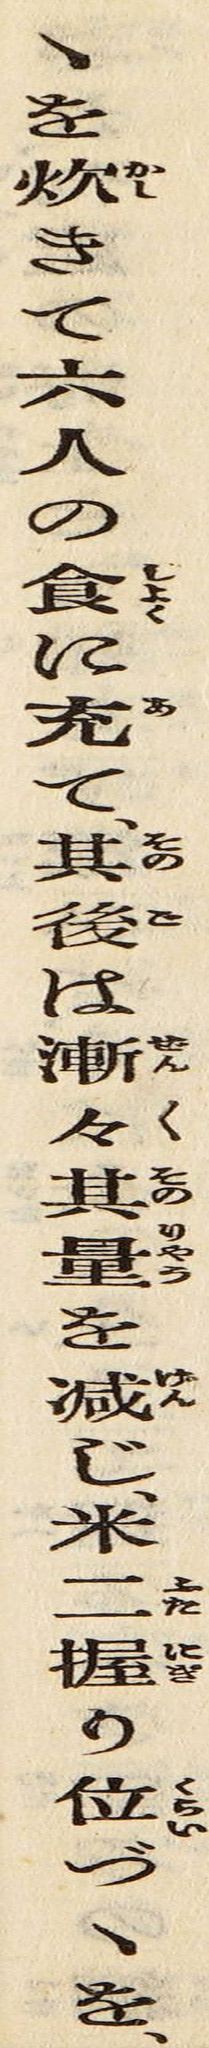ヽを炊きて六人の食に充て、其後は漸々其量を減じ、米二握り位づヽを、
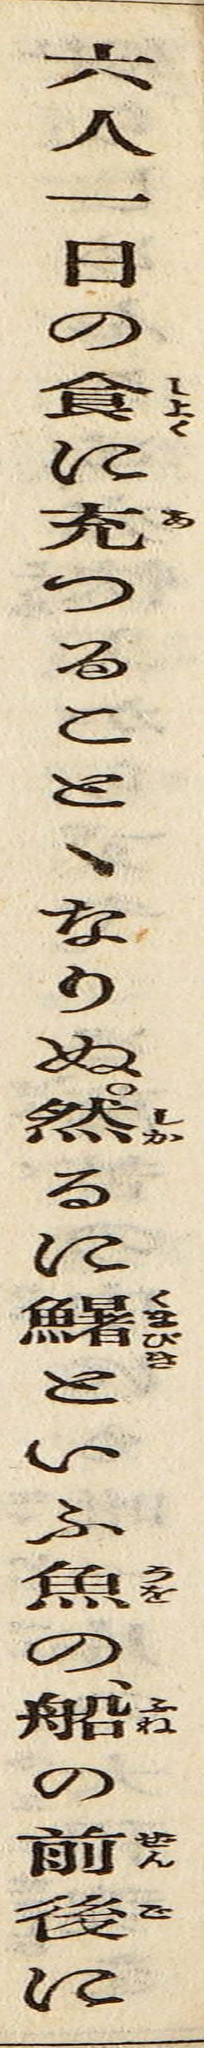六人一日の食に充つることヽなりぬ。然るに鱪といふ魚の、船の前後に
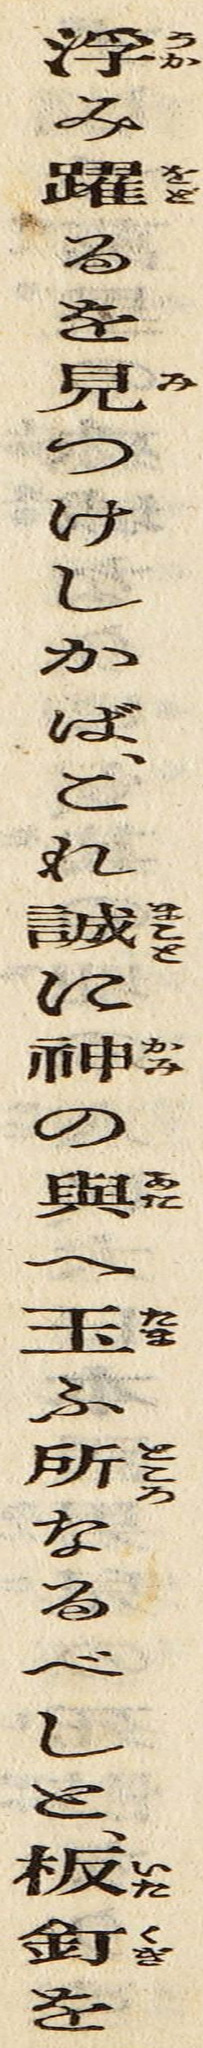浮み躍るを見つけしかば、これ誠に神の与へ玉ふ所なるべしと、板釘を
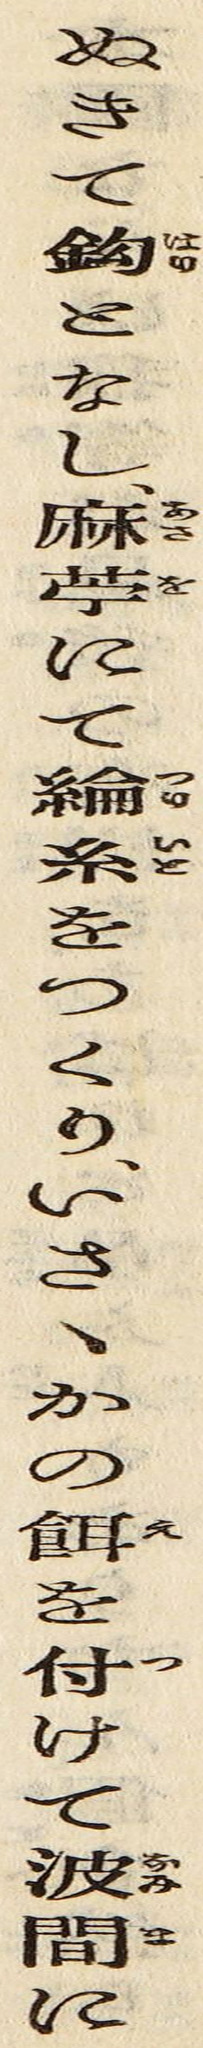ぬきて鈎となし、麻苧にて綸糸をつくり、いさヽかの餌を付けて波間に
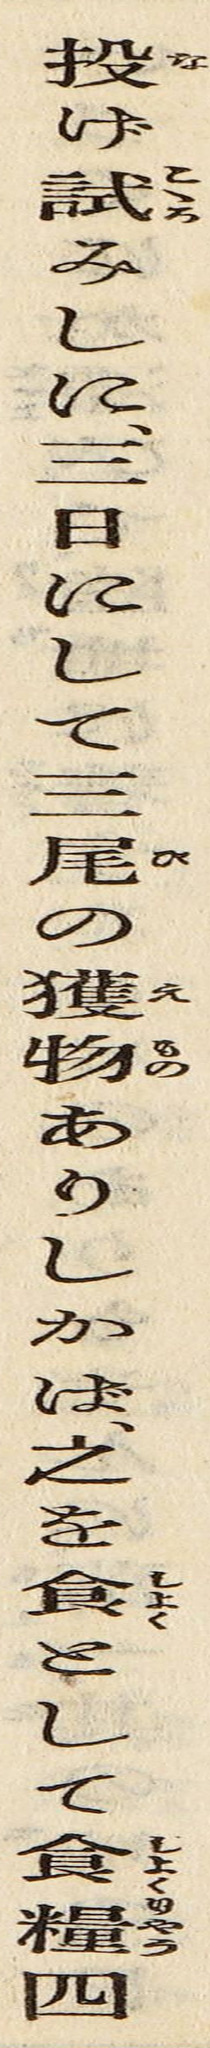投げ試みしに、三日にして三尾の獲物ありしかば、之を食として食糧四
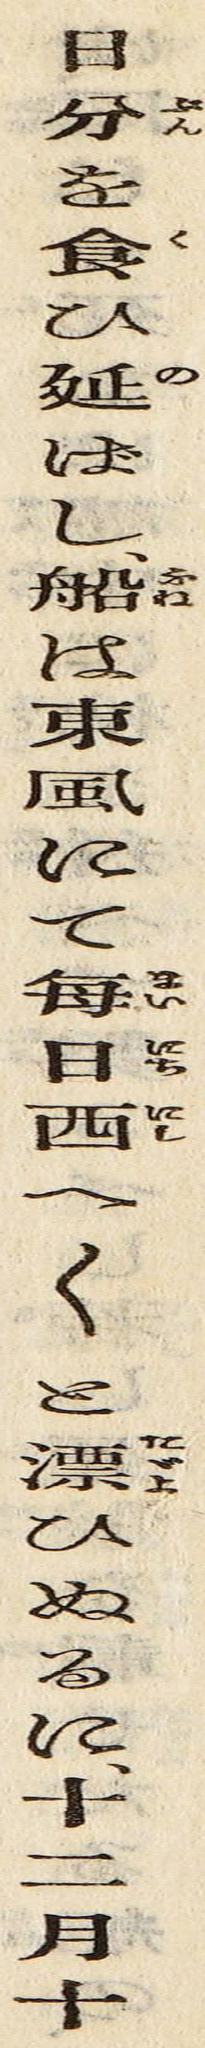日分を食ひ延ばし、船は東風にて毎日西へ〳〵と漂ひぬるに、十二月十
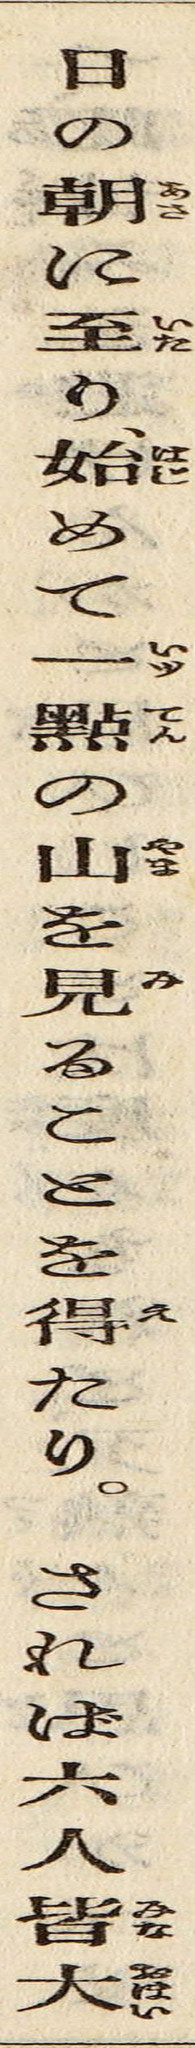日の朝に至り、始めて一点の山を見ることを得たり。されば六人皆大
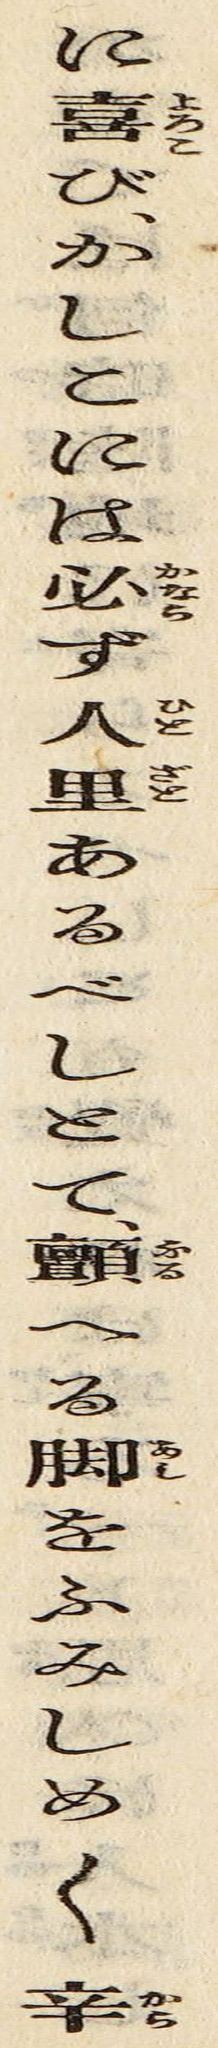に喜び、かしこには必ず人里あるべしとて、顫へる脚をふみしめ〳〵辛
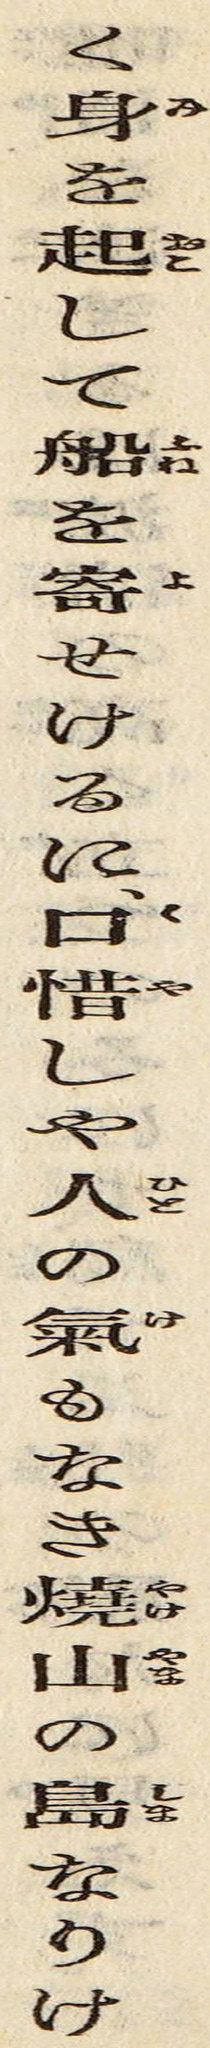く身を起して船を寄せけるに、口惜しや人の気もなき焼山の島なりけ
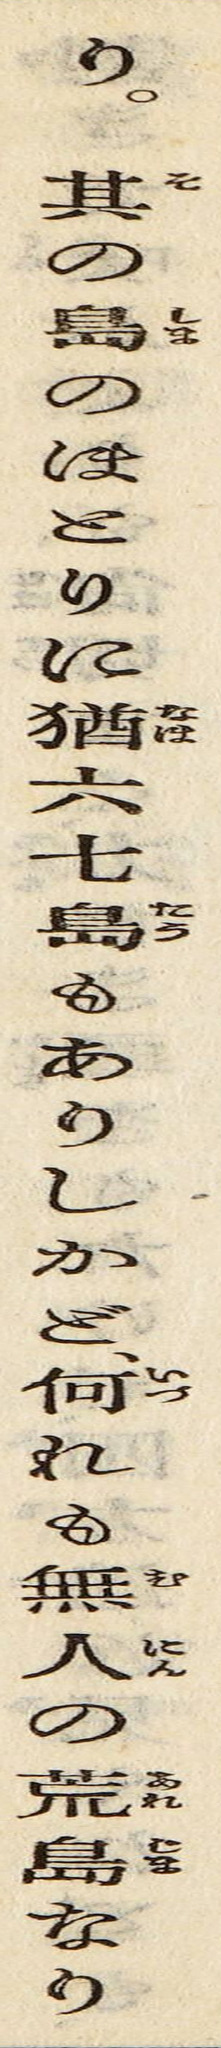り。其の島のほとりに猶六七島もありしかど、何れも無人の荒島なり
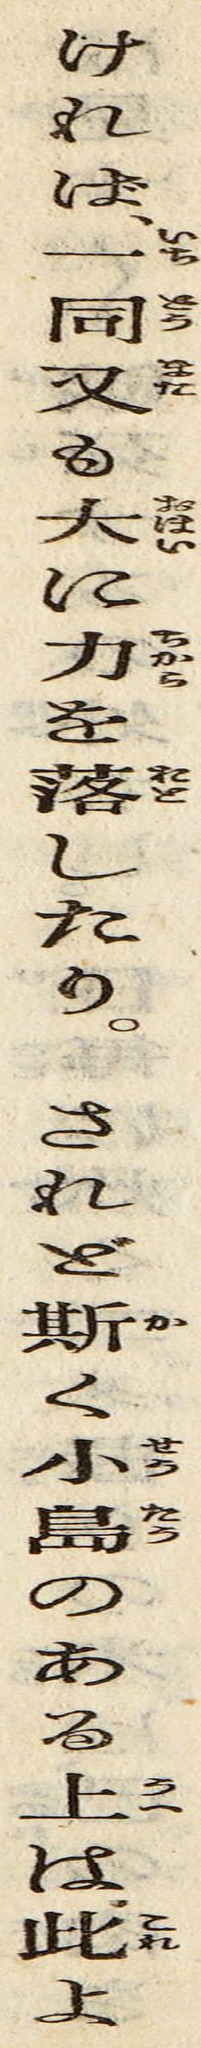ければ、一同又も大に力を落したり。されど斯く小島のある上は此よ
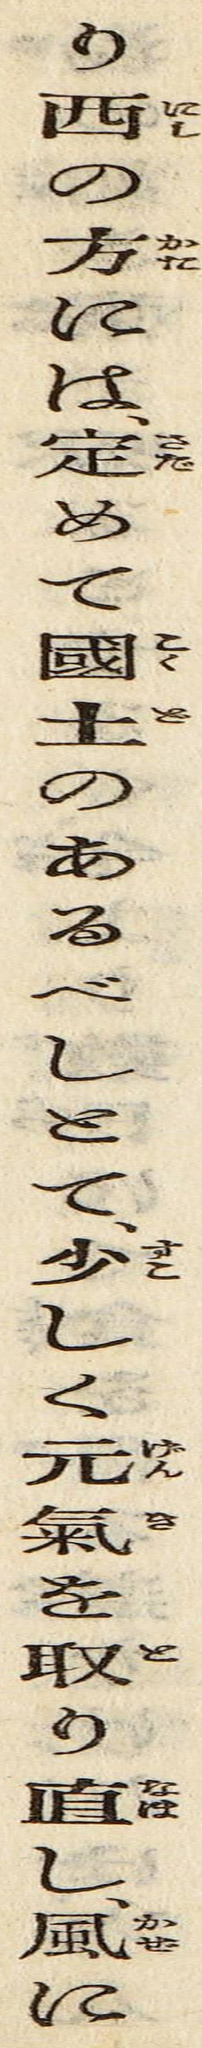り西の方には、定めて国土のあるべしとて、少しく元気を取り直し、風に
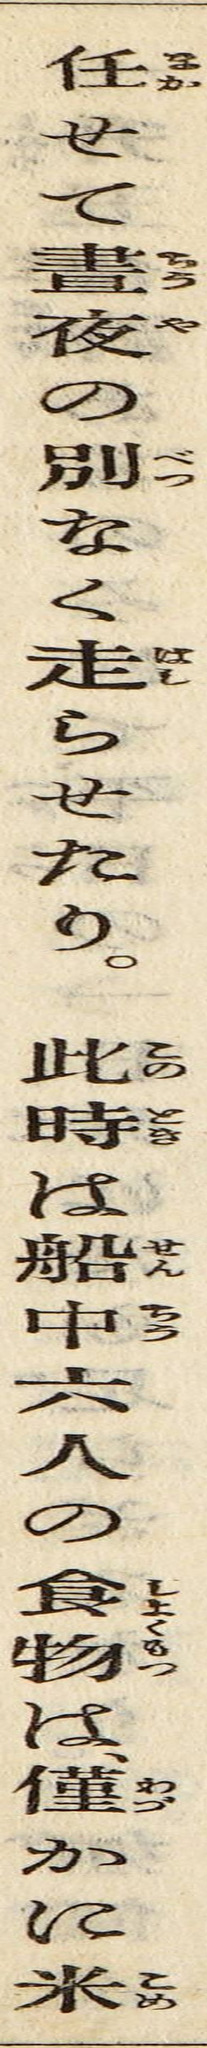任せて昼夜の別なく走らせたり。此時は船中六人の食物は、僅かに米

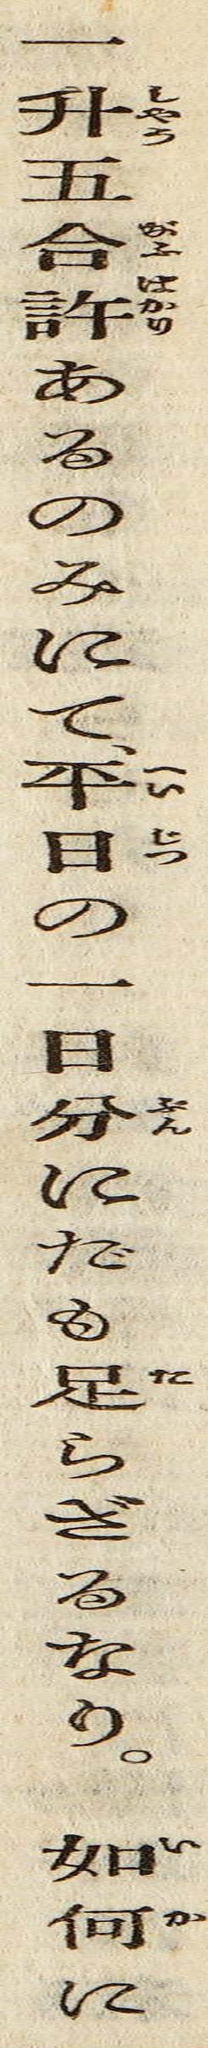一升五合許あるのみにて、平日の一日分にだも足らざるなり。如何に
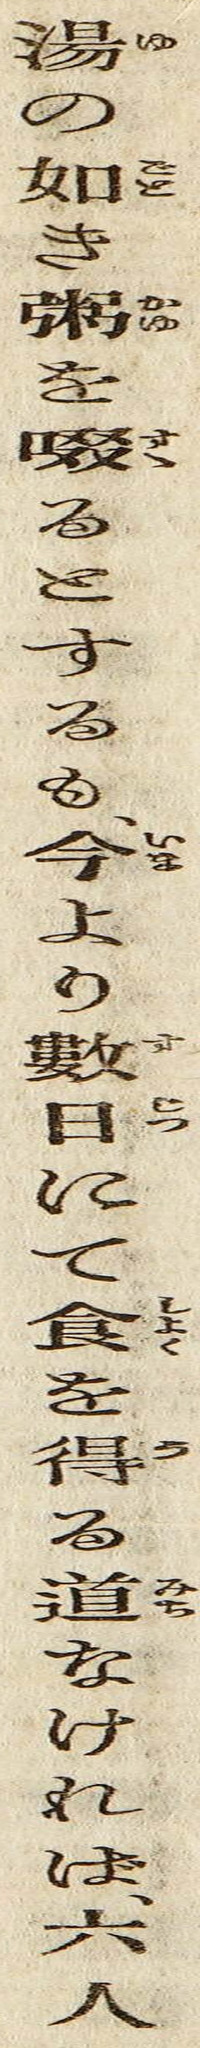湯の如き粥を啜るとするも、今より数日にて食を得る道なければ、六人
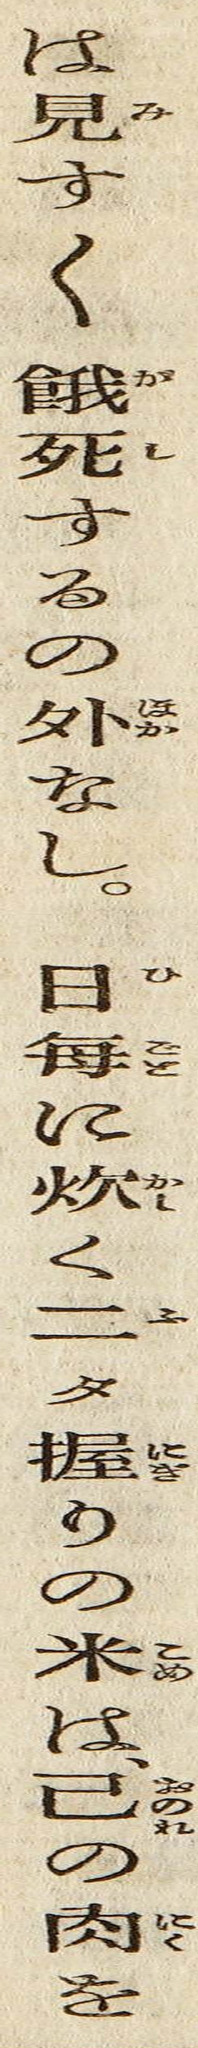は見す〳〵餓死するの外なし。日毎に炊く二タ握りの米は、己の肉を
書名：日本漂流譚
